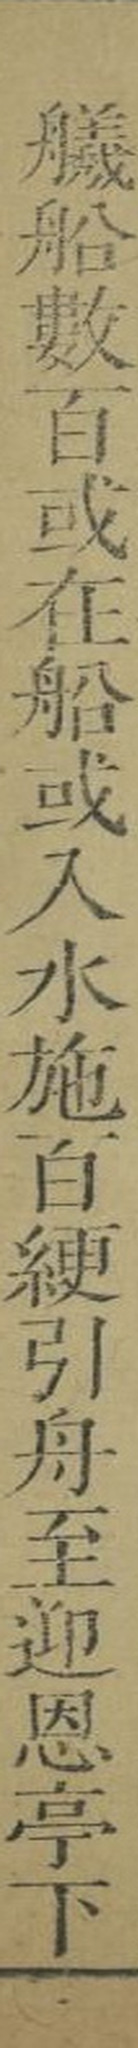艤船數百或在船或入水施百綆引舟至迎恩亭下

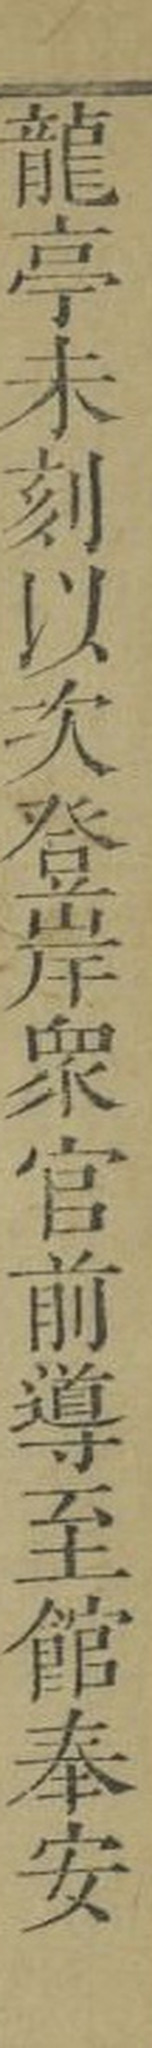龍亭未刻以次登岸衆官前導至館奉安
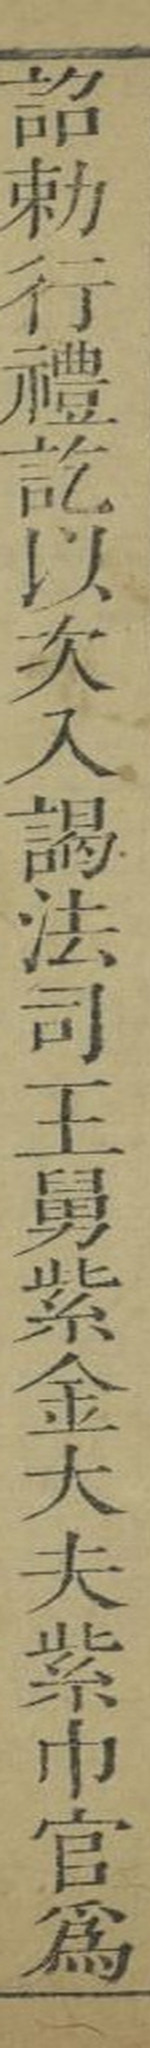詔勅行禮訖以次入謁法司王舅紫金大夫紫巾官爲
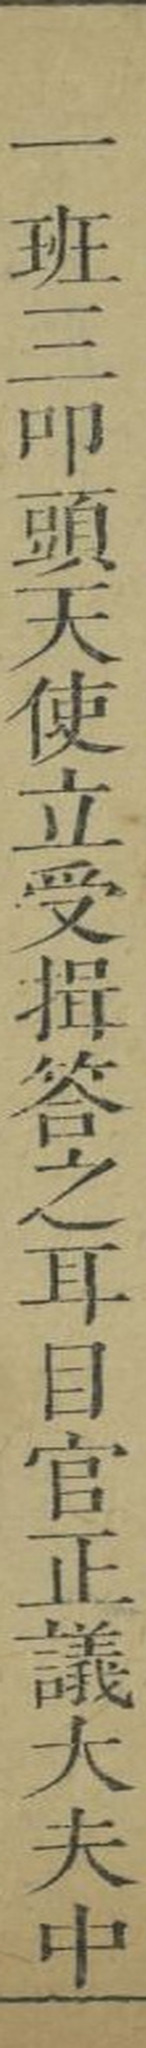一班三叩頭天使立受揖答之耳目官正議大夫中
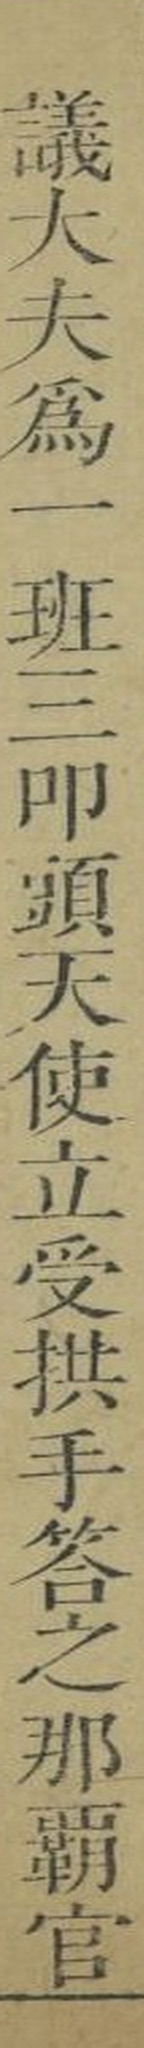議大夫爲一班三叩頭天使立受拱手答之那覇官
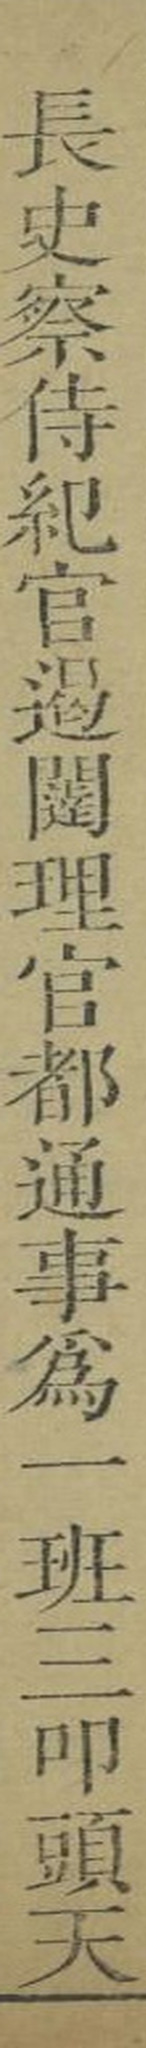長史察侍紀官遏闥理官都通事爲一班三叩頭天
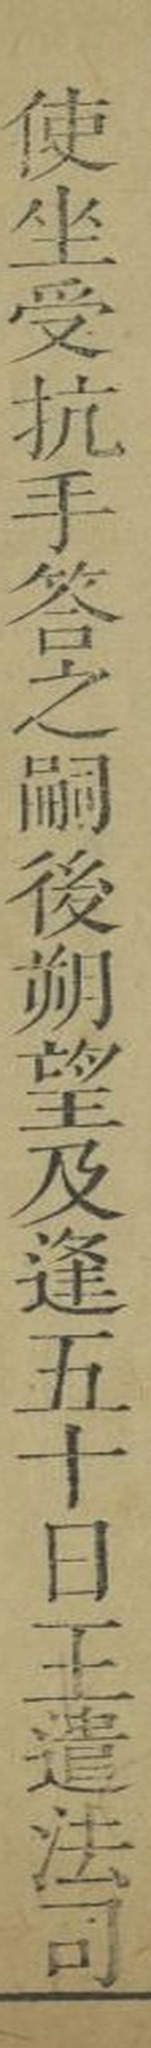使坐受抗手答之嗣後朔望及逢五十日王遣法司
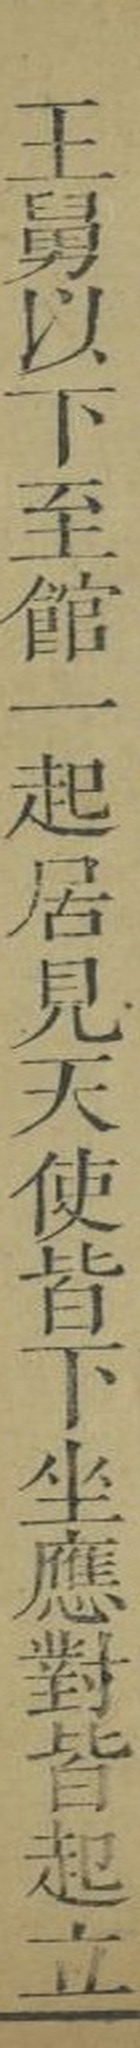王舅以下至館一起居見天使皆下坐應對皆起立
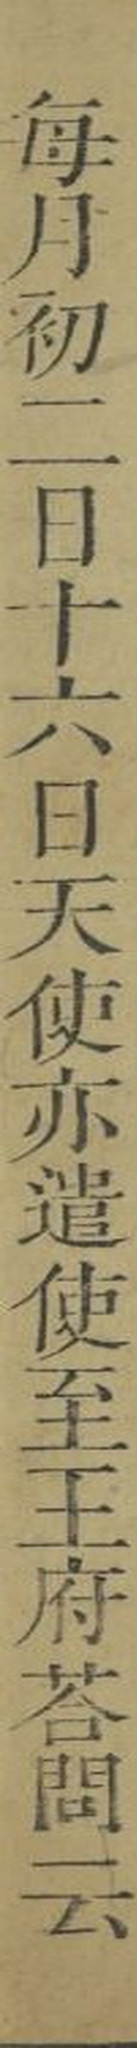每月初二日十六日天使亦遣使至王府荅問云

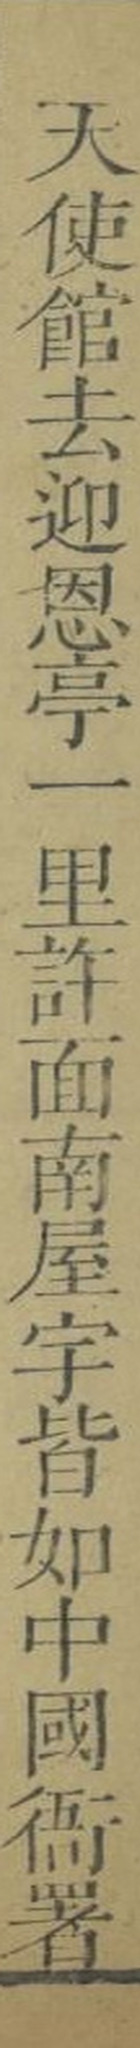天使館去迎恩亭一里許面南屋宇皆如中國衙署
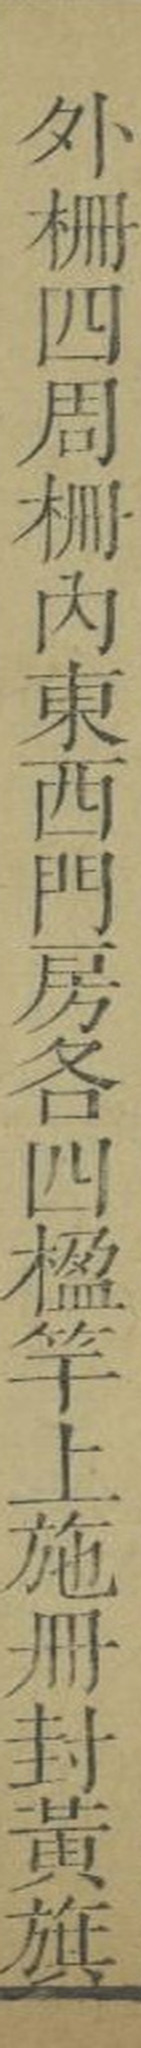外柵四周柵内東西門房各四楹竿上施冊封黃旗
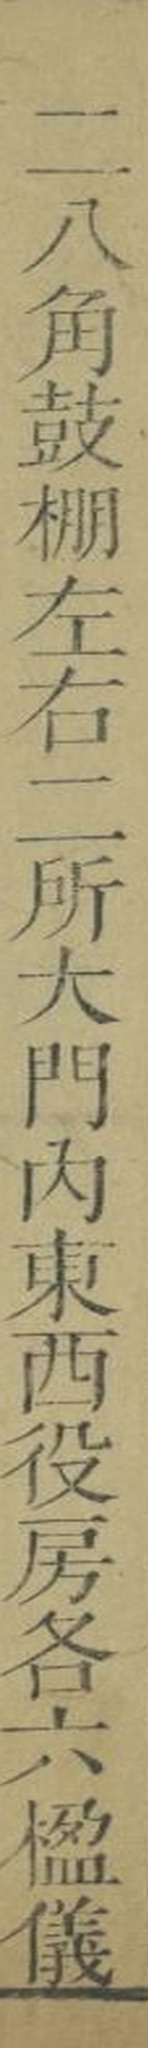二八角鼓棚左右二所大門内東西役房各六楹儀
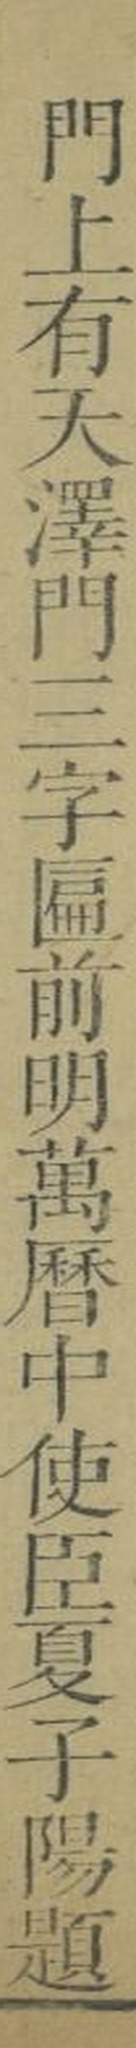門上有天澤門三字匾前明萬曆中使臣夏子陽題
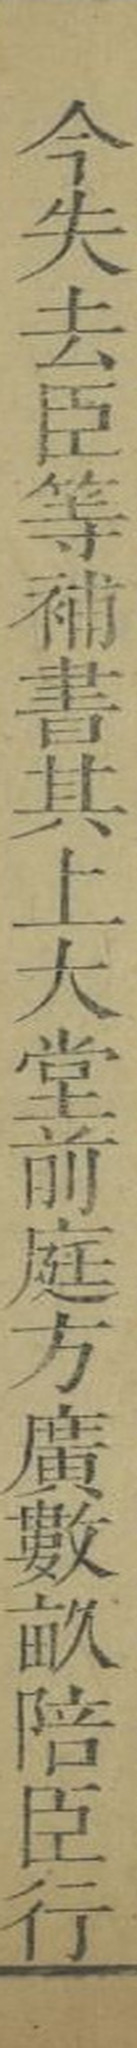今失去臣等補書其上大堂前庭方廣數畝陪臣行
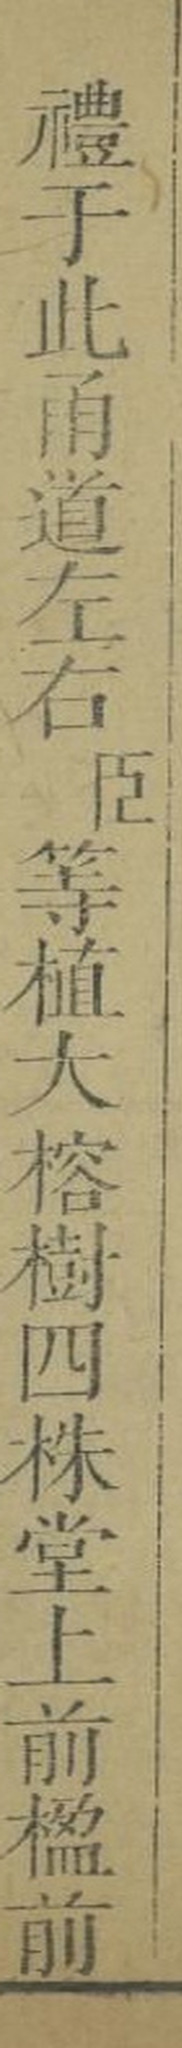禮于此甬道左右臣等植大榕樹四株堂上前楹前
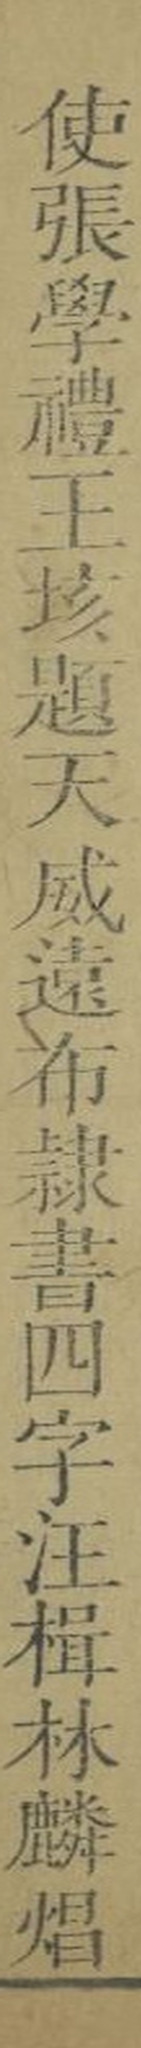使張學禮王垓題天威遠布隷書四字汪楫林麟焻
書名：中山伝信録 巻二
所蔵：University of the Ryukyus Library
